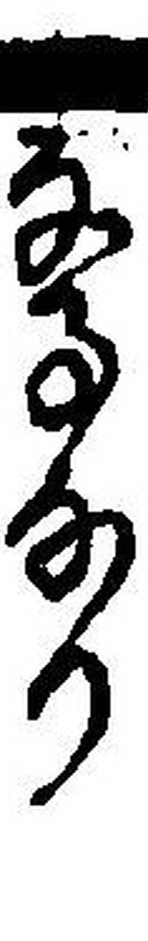な事なり
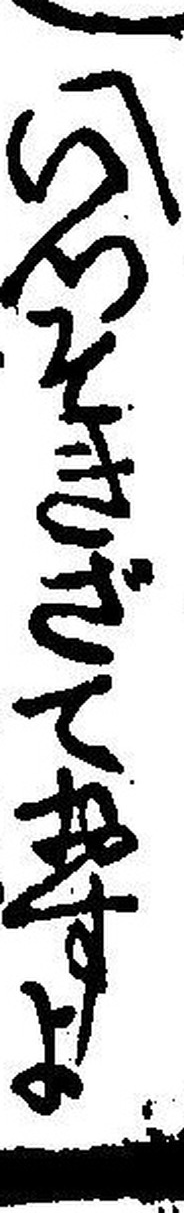〽いつそきざておすよ
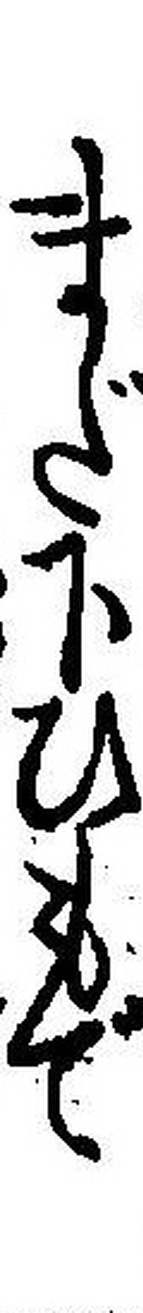まだ下ひもで
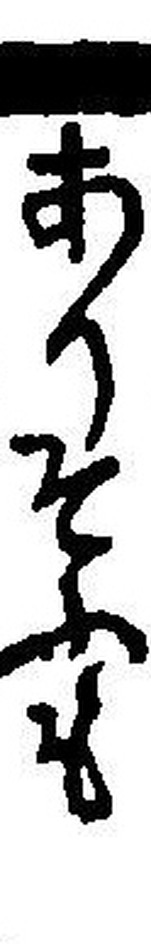ありそふも
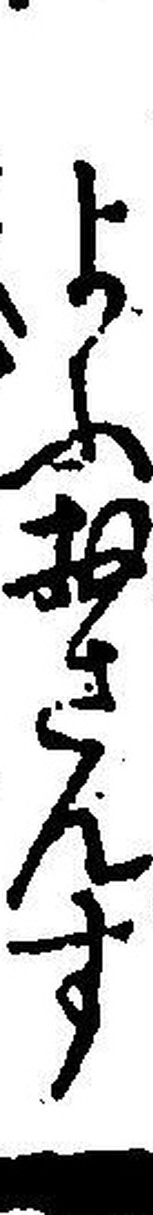よふおさんす
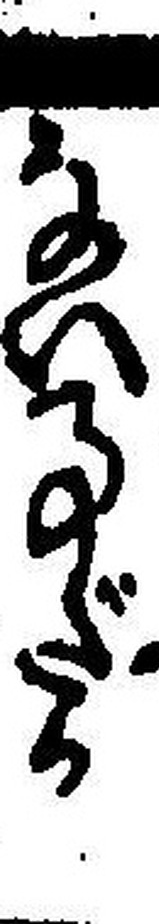ない事だか
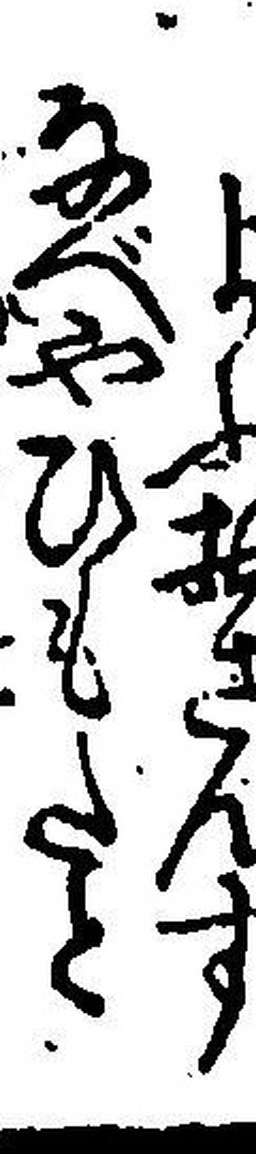なべやひもたと
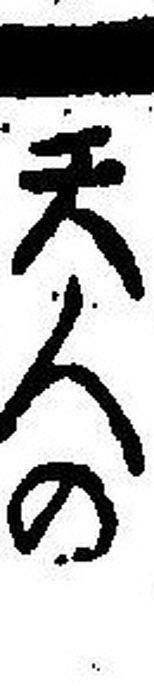天人の
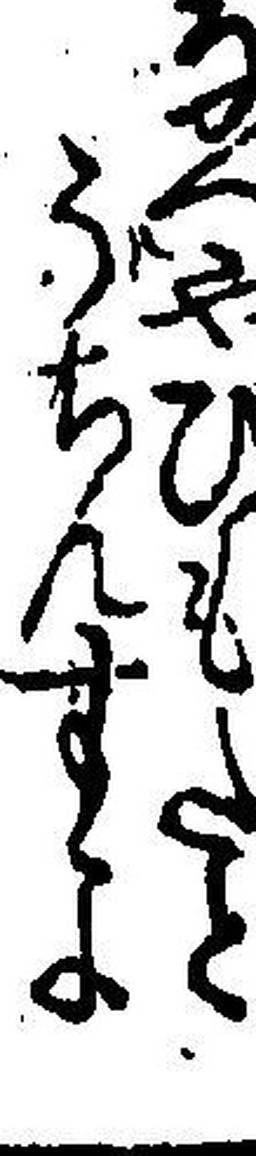うちんすよ
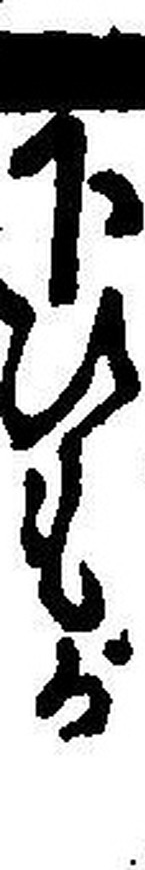下ひもが
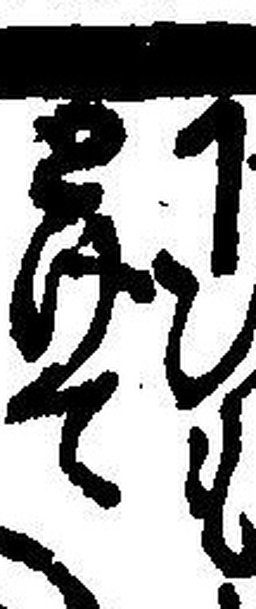とけて
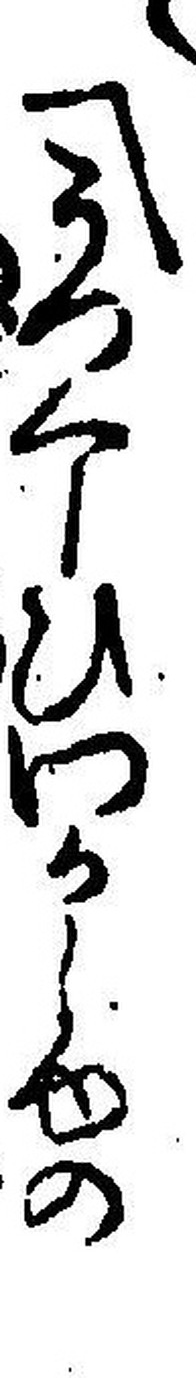〽うつくしひわかしゆの
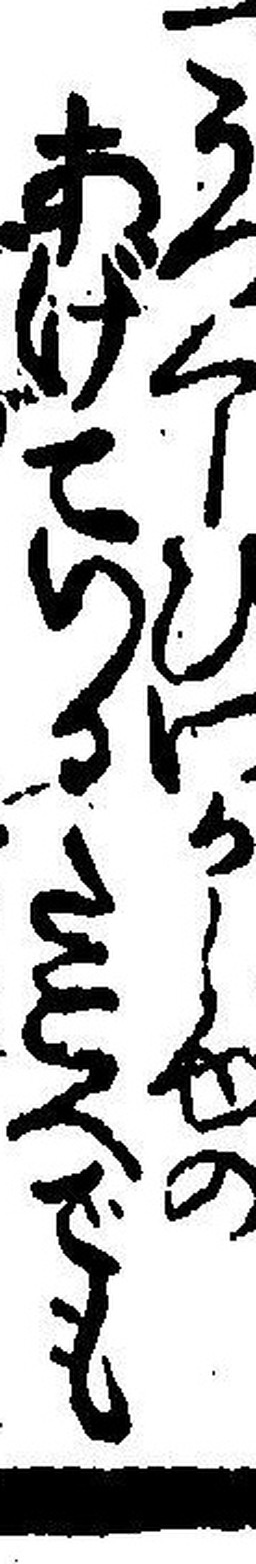あげているたこへでも
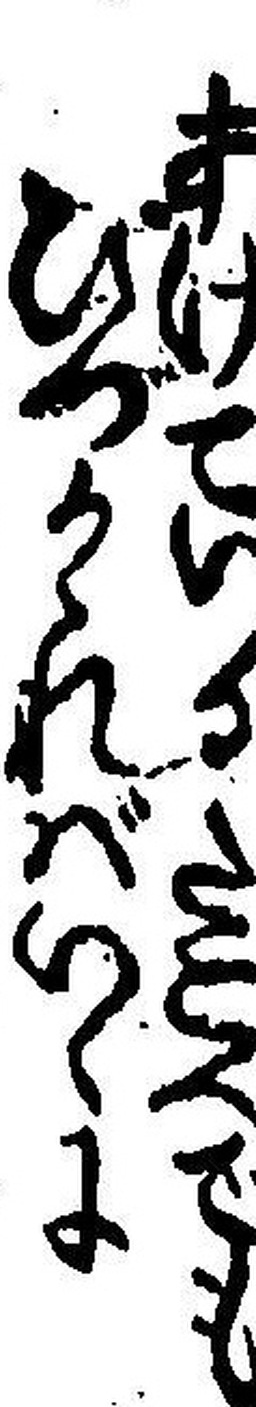ひつかゝればいゝよ
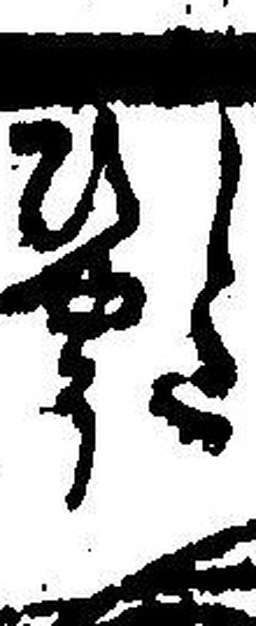ひやう
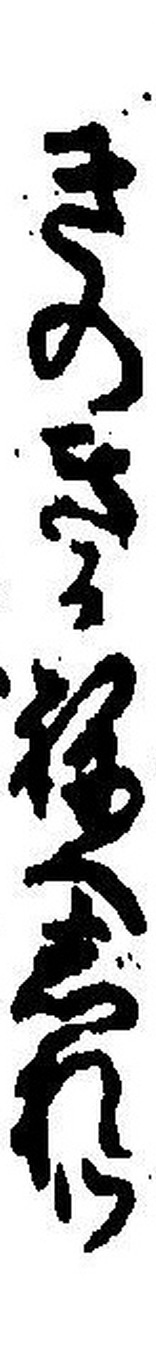きのきかねへしれつ
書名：徳若水縁起金性 / 樹下石上作
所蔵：東京大学総合図書館 General Library in the University of Tokyo, JAPAN
